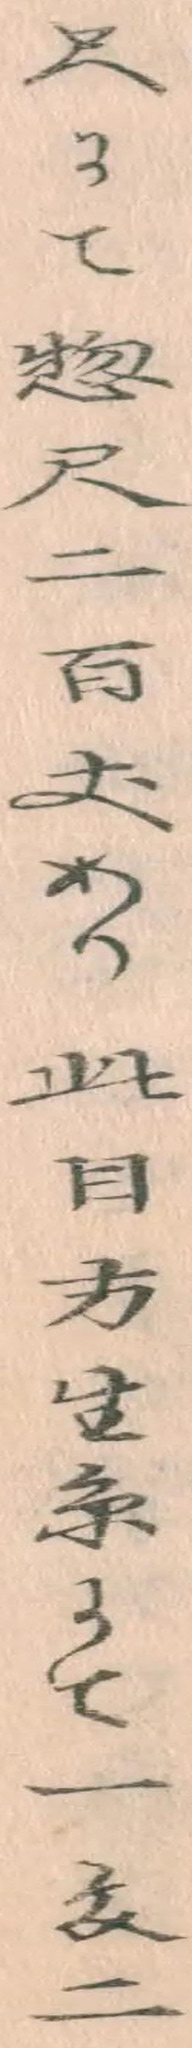尺にて惣尺二百丈あり此目方生糸にて一匁二
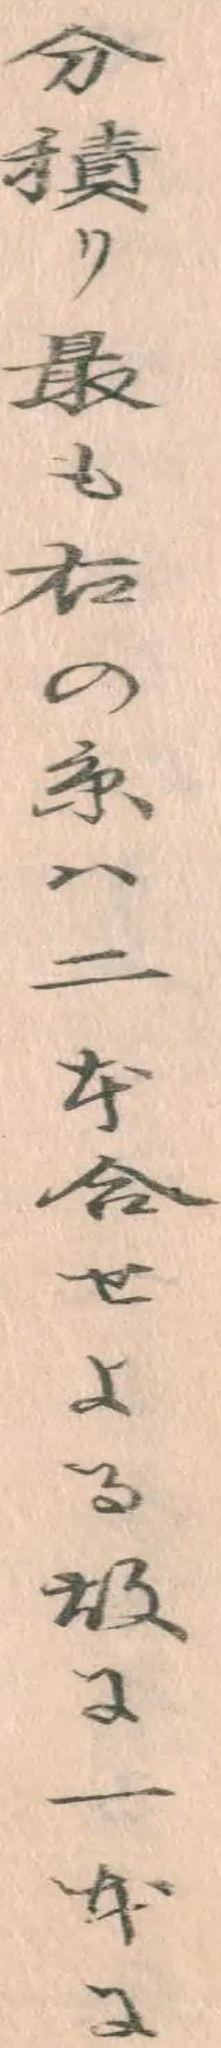分積り最も右の糸は二本合せよる故に一本に
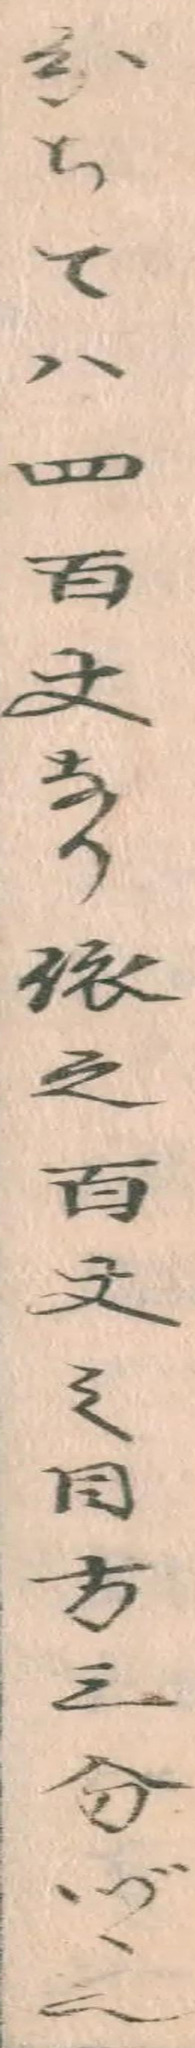分ちては四百丈なり依之百丈之目方三分づゝ也
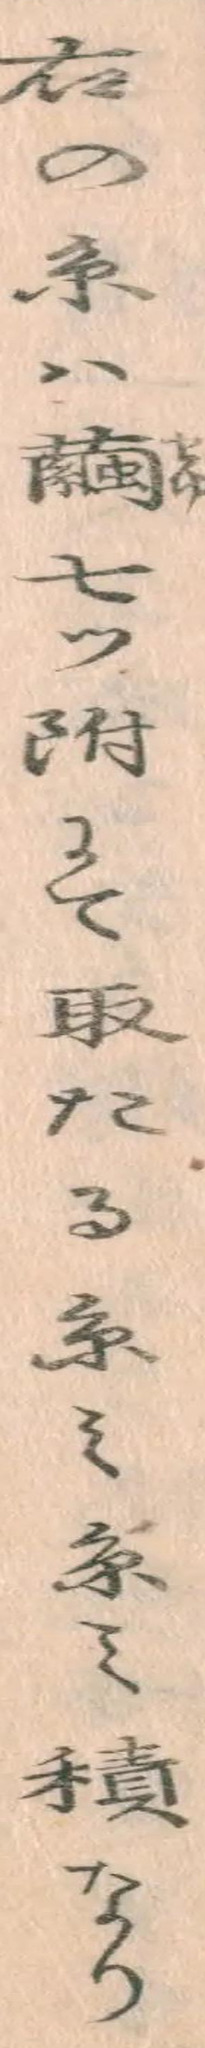右の糸は繭七ッ附にて取たる糸之糸之積なり
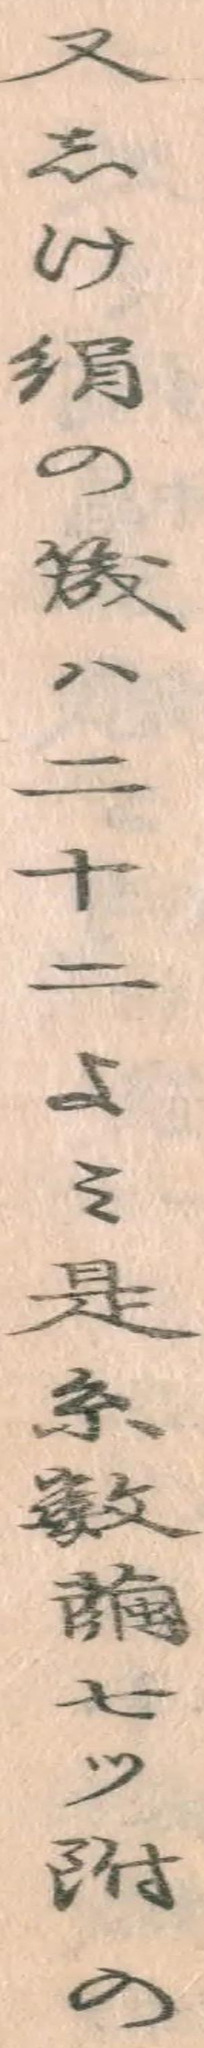又しけ絹の筬は二十二よみ是糸数繭七ッ附の
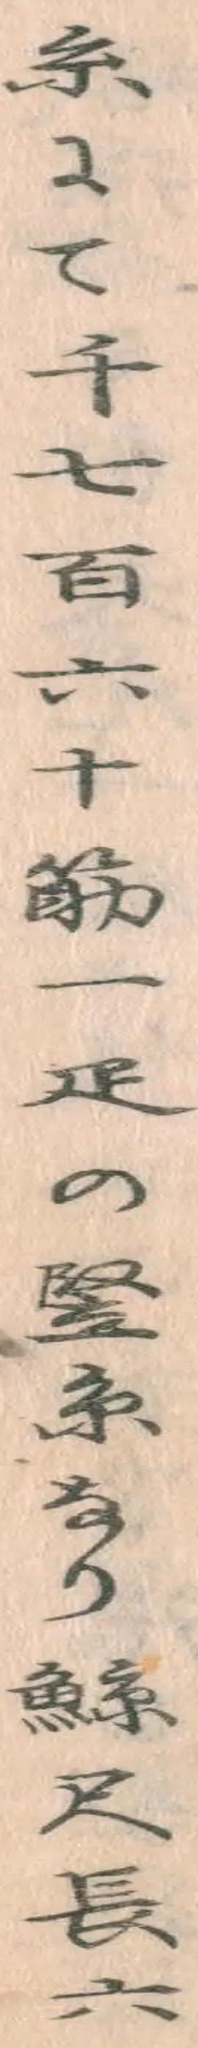糸にて千七百六十筋一疋の竪糸なり鯨尺長六
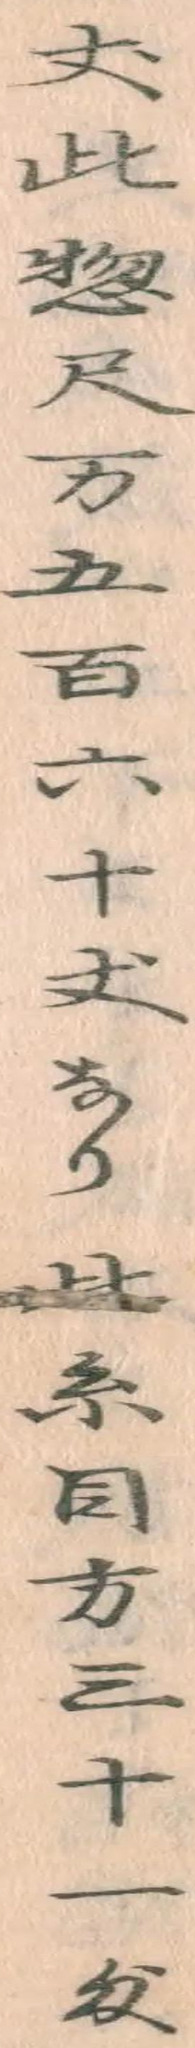丈此惣尺万五百六十丈なり此糸目方三十一匁
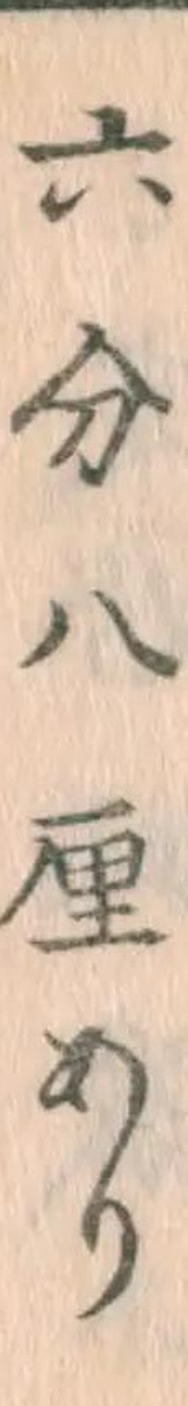六分八厘あり
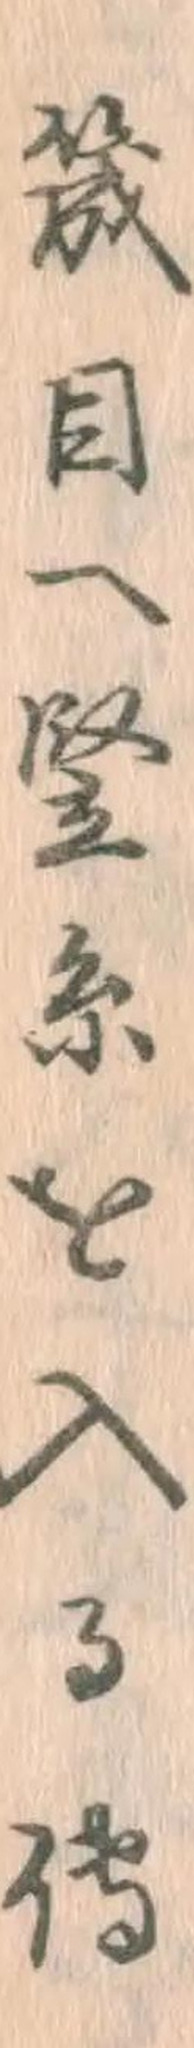筬目へ竪糸を入る伝
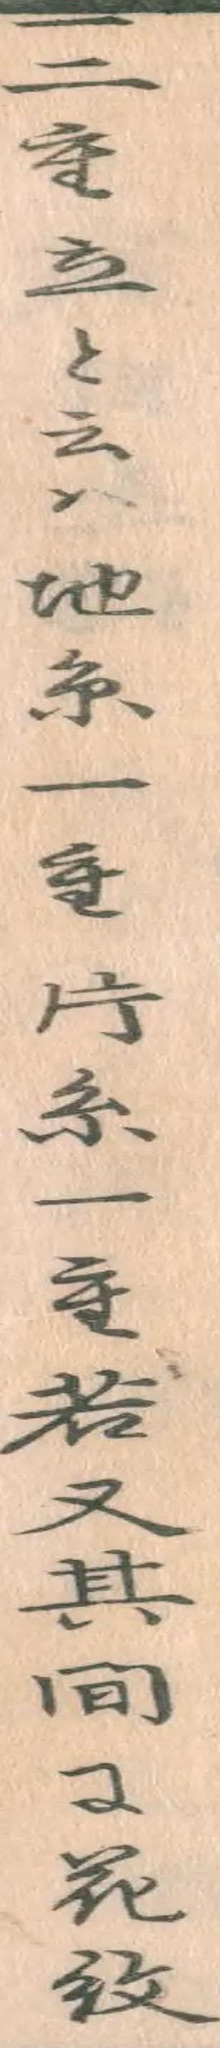一二重立と云は地糸一重片糸一重若又其間に花紋
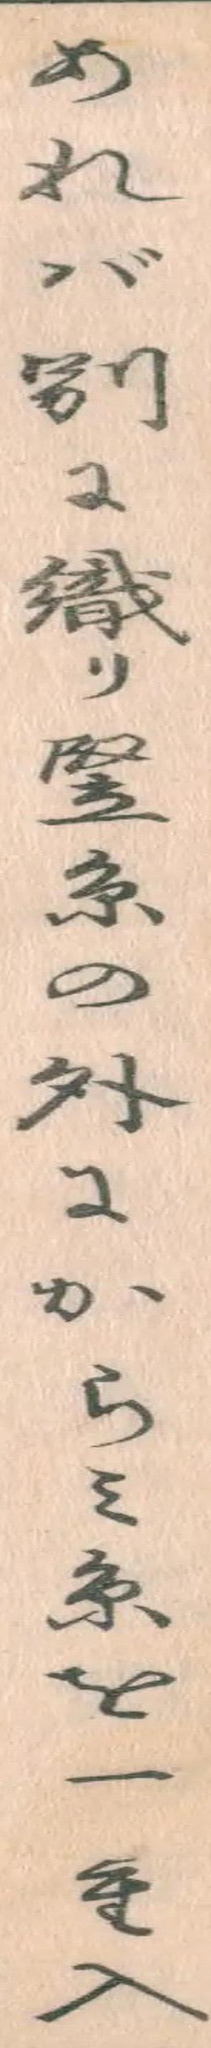あれば別に織り竪糸の外にからみ糸を一重入
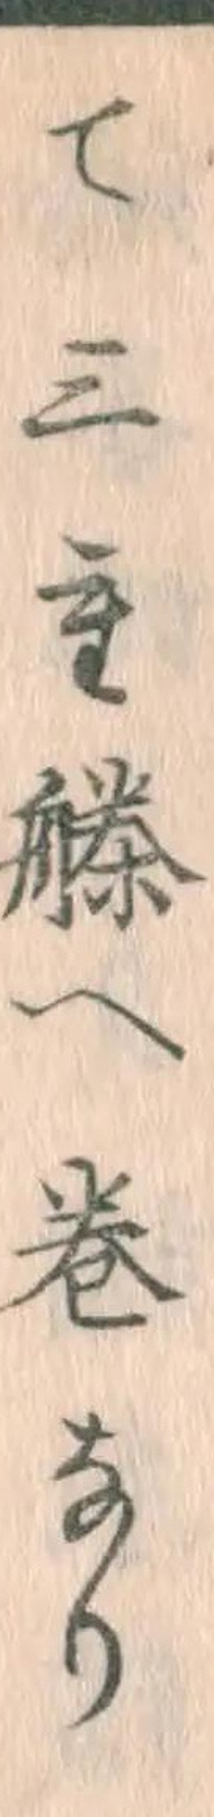て三重𣚗へ巻なり
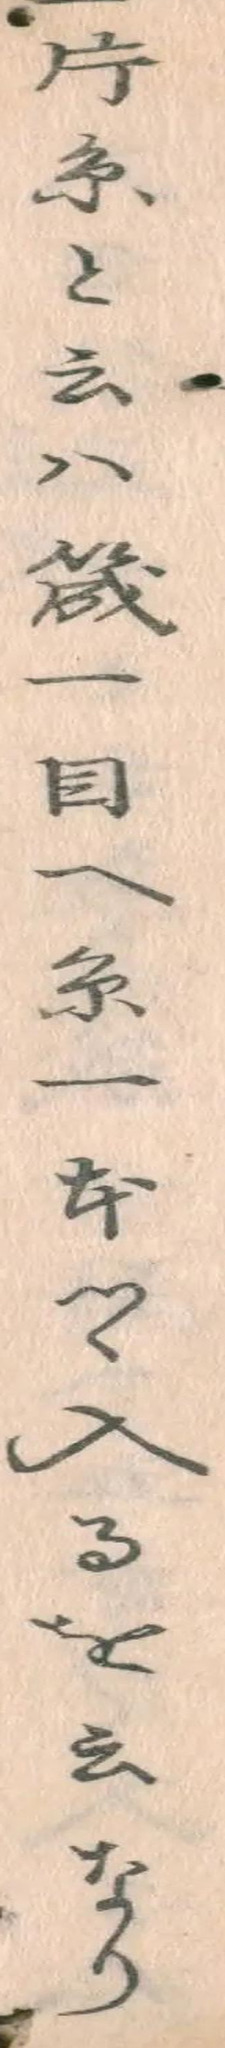一片糸と云は筬一目へ糸一本つゝ入るを云なり
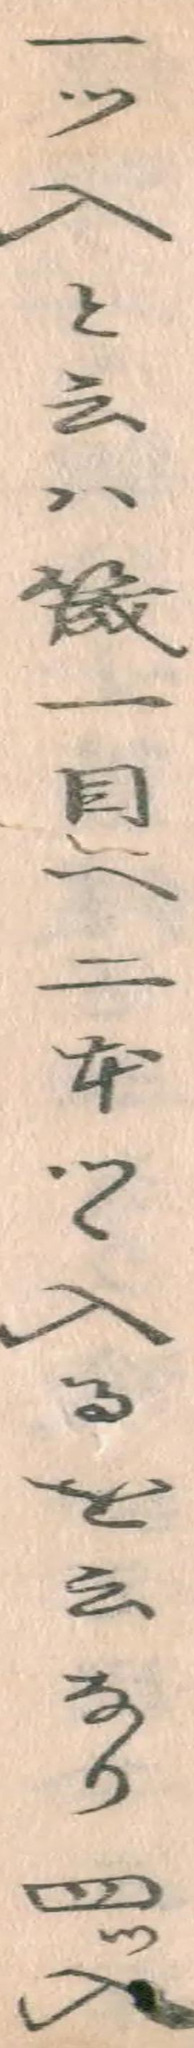一ッ入と云は筬一目へ二本つゝ入るを云なり四ッ入
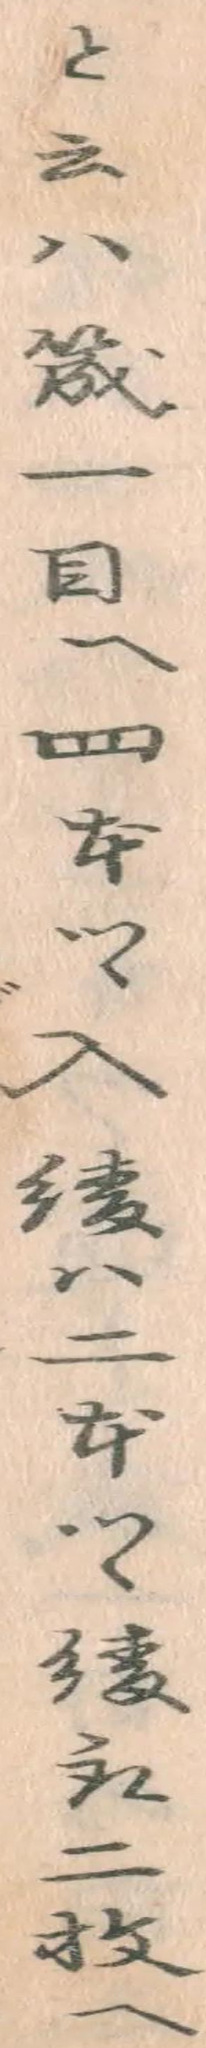と云は筬一目へ四本つゝ入綾は二本つゝ綾取二枚へ
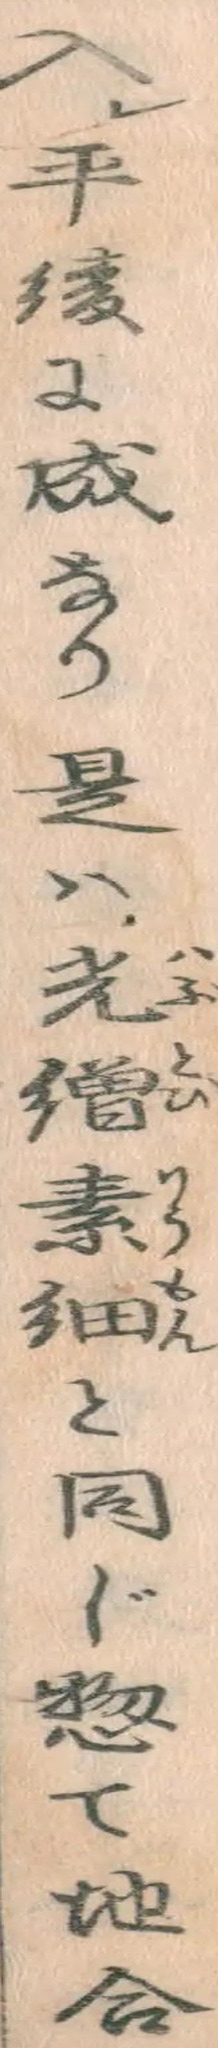入れ平綾に成なり是は光繒素細と同じ惣て地合
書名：機織彙編 5巻. [2]
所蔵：国立国会図書館 National Diet Library, JAPAN
